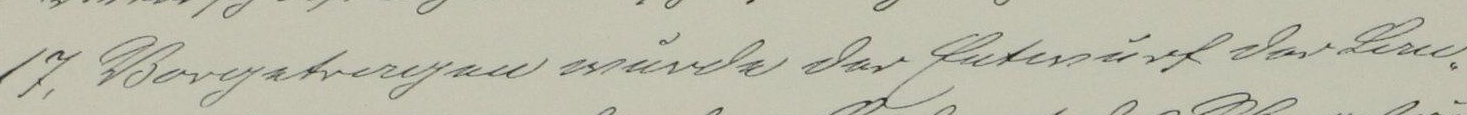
17. Vorgetragen wurde der Entwurf der Lan-
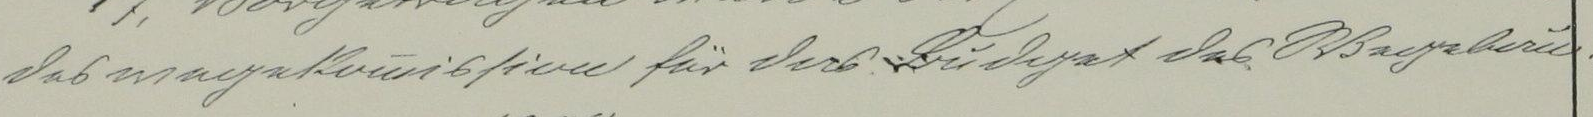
deswegekommission für das Budget des Wegebau-
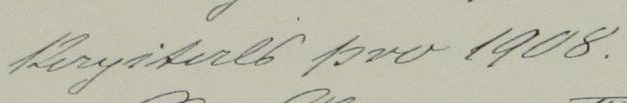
kapitals pro 1908.
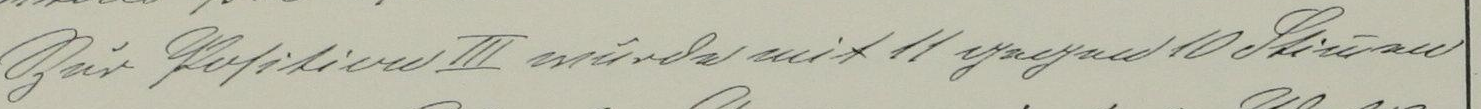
Zur Position III wurde mit 11 gegen 10 Stimmen
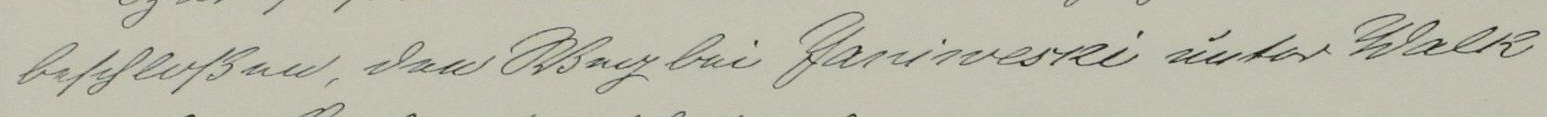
beschloßen, den Weg bei Janiweski unter Walk
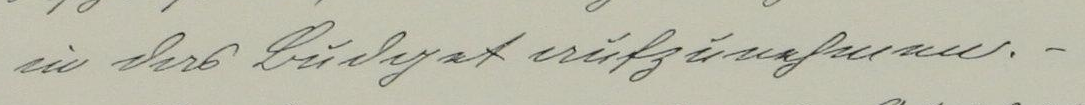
in das Budget aufzunehmen.
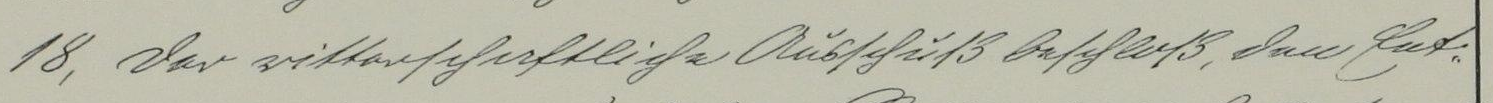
18. Der ritterschaftliche Ausschuß beschloß, den Ent-
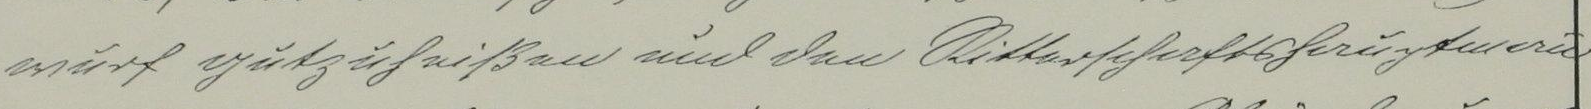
wurf gutzuheißen und den Ritterschaftshauptmann
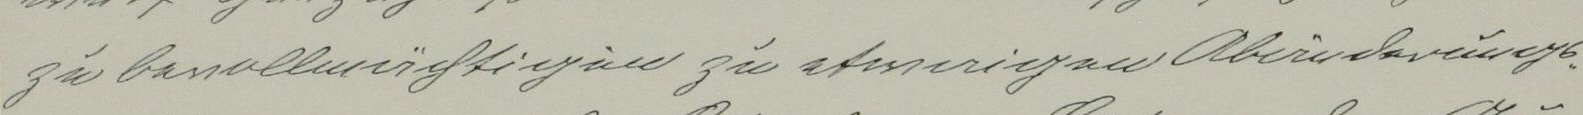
zu bevollmächtigen zu etwaigen Abänderungs-
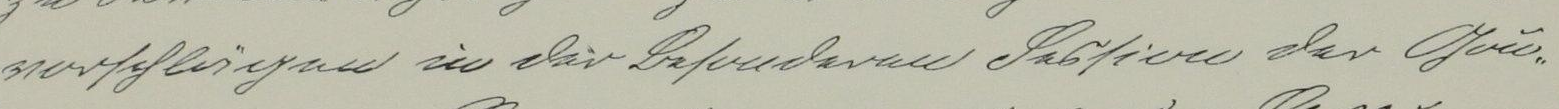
vorschlägen in der Besonderen Session der Gou-
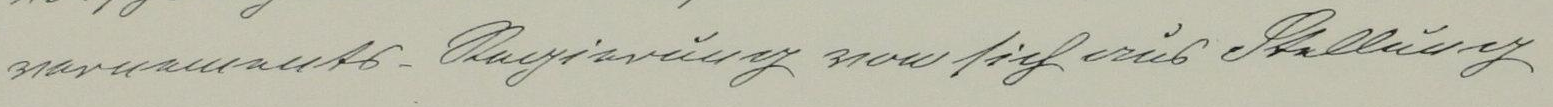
vernements-Regierung von sich aus Stellung
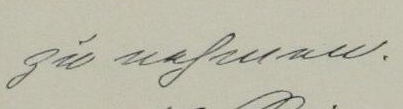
zu nehmen.
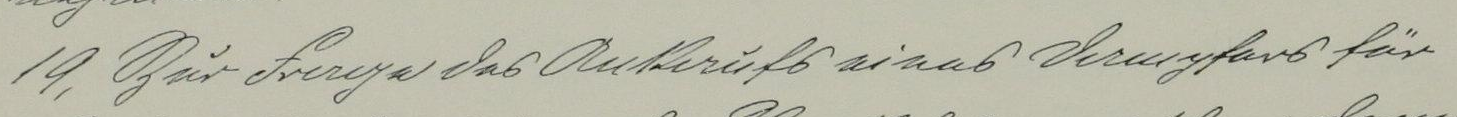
19. Zur Frage des Ankaufs eines Dampfers für
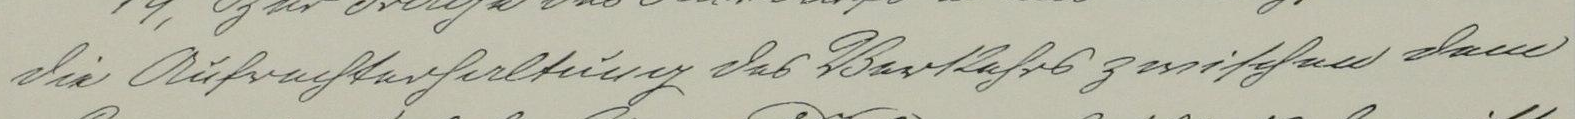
die Aufrechterhaltung des Verkehrs zwischen dem
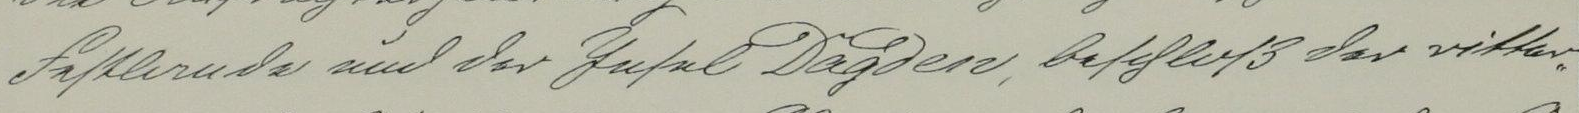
Festlande und der Insel Dagden, beschloß der ritter-
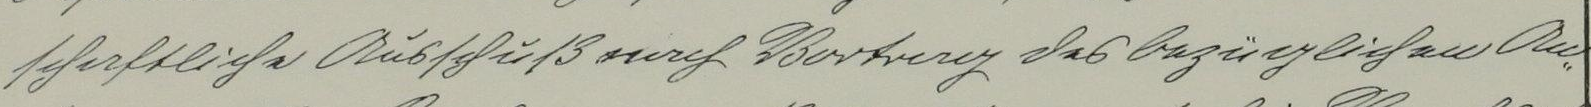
schaftliche Ausschuß nach Vortrag des bezüglichen An-
